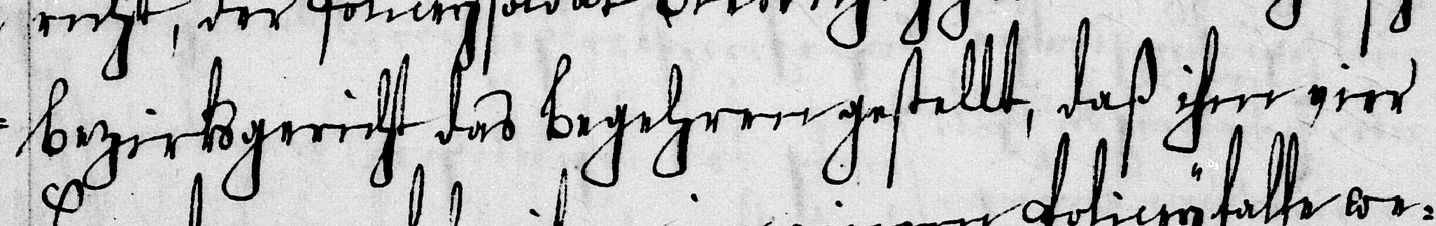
Bezirksgericht das Begehren gestellt, daß ihm vier
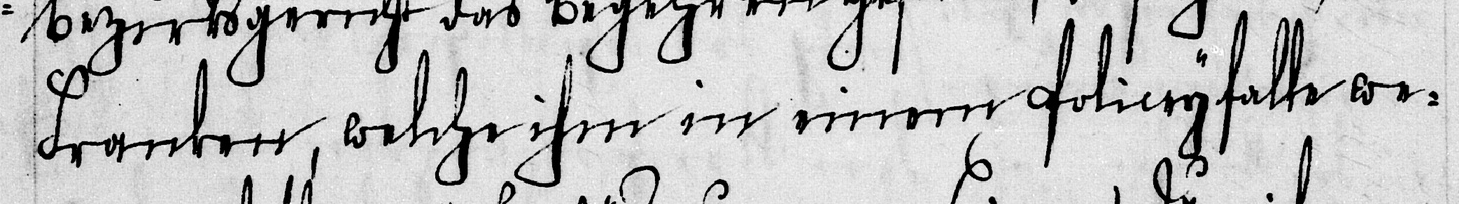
Franken, welche ihm in einem Policeyfalle we¬
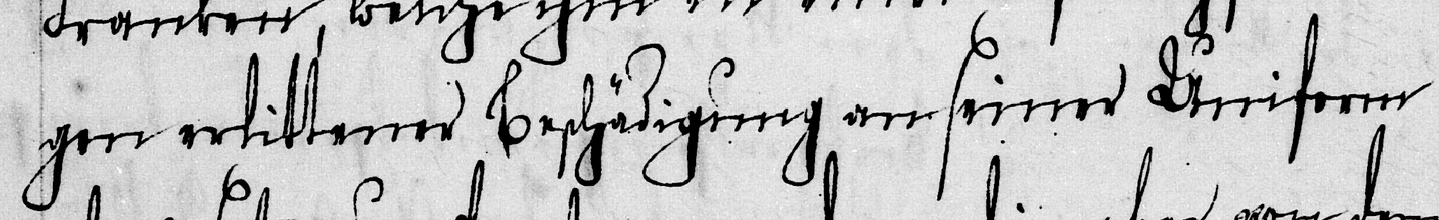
gen erlittener Beschädigung an seiner Uniform
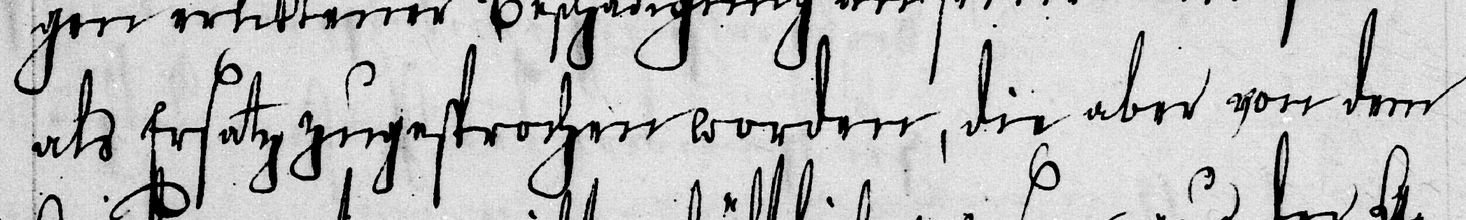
als Ersatz zugesprochen worden, die aber von dem
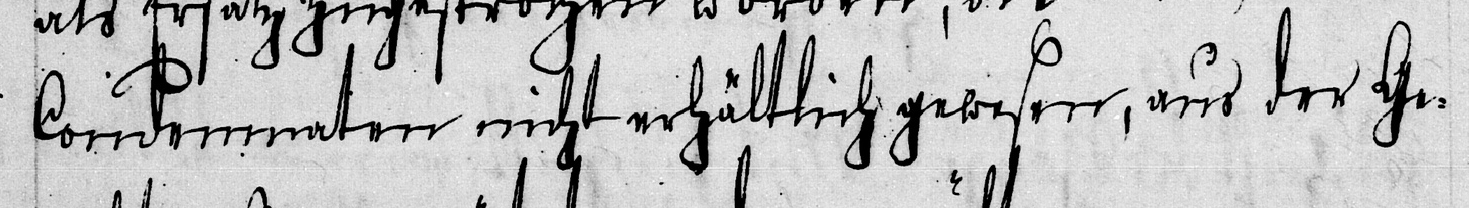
Condemnaten nicht erhältlich gewesen, aus der Ge¬
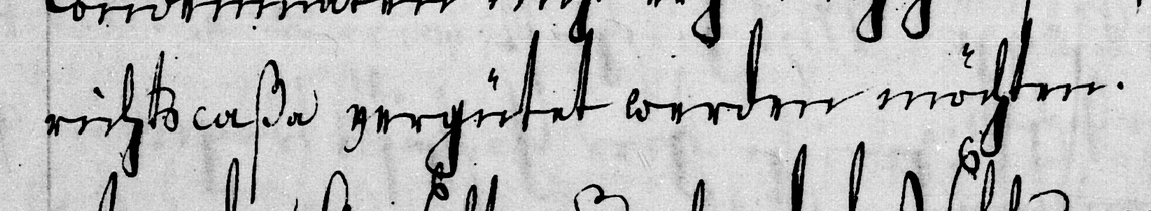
richtscaßa vergütet werden möchten.
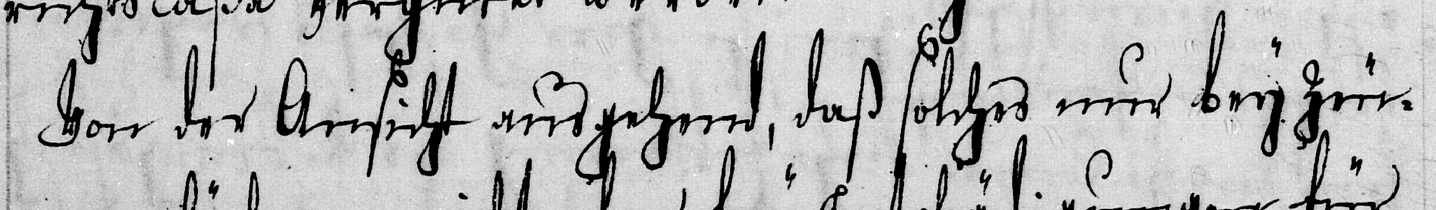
Von der Ansicht ausgehend, daß solches nur bey Zeu¬
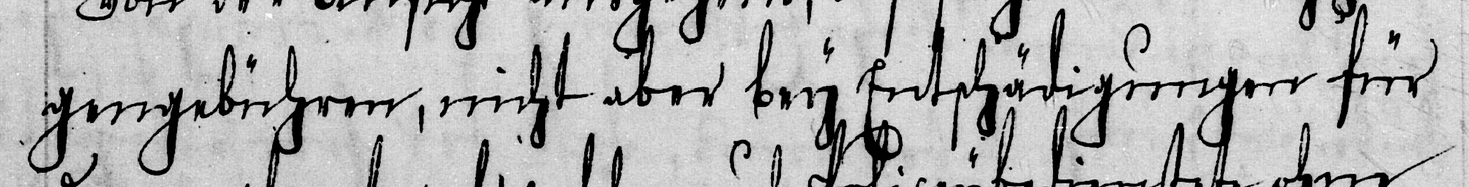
gengebühren, nicht aber bey Entschädigungen für
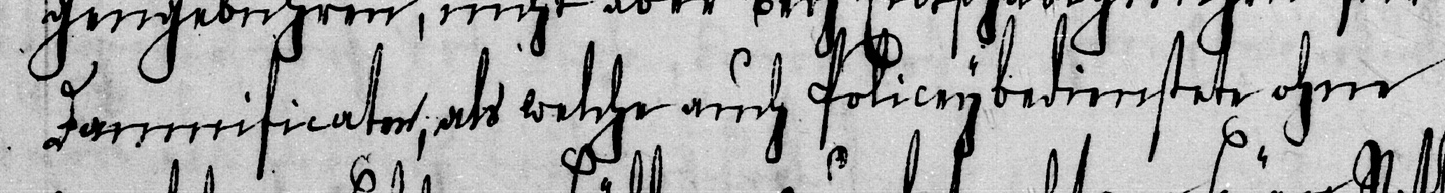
Damnificaten, als welche auch Policeybedienstete ohne
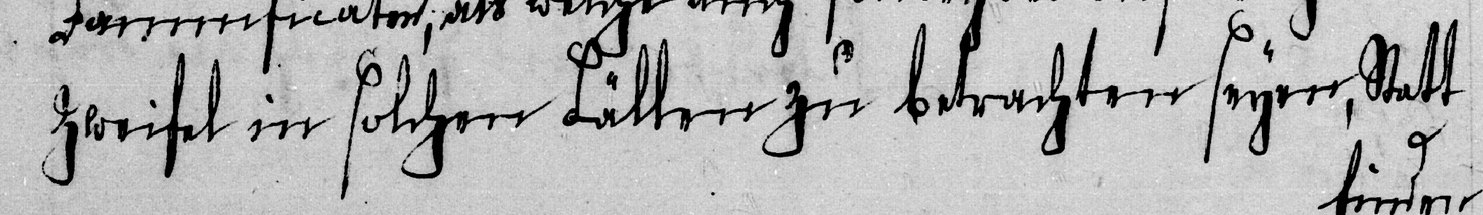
Zweifel in solchen Fällen zu betrachten seyen, Statt
